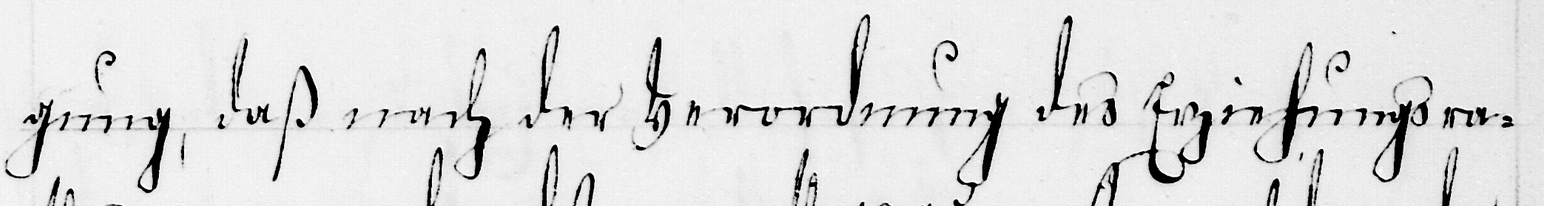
gung, daß nach der Verordnung des Erziehungsra¬
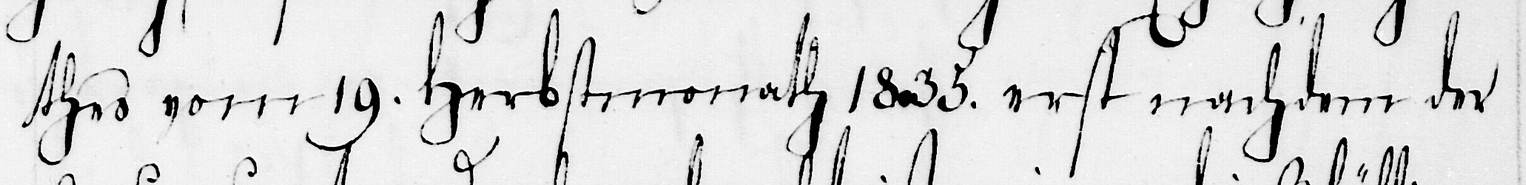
thes vom 19. Herbstmonath 1835. erst nachdem der
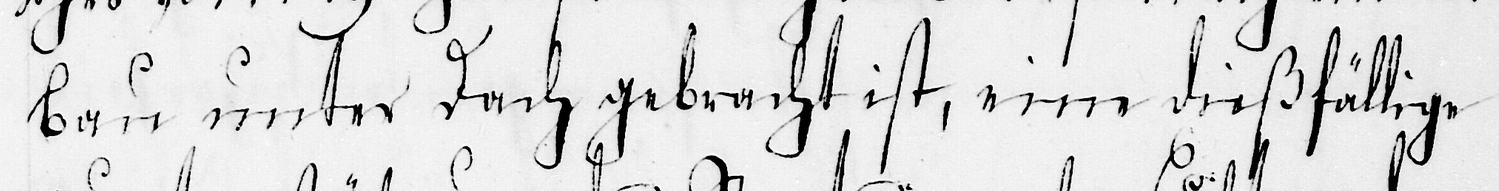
Bau unter Dach gebracht ist, eine dießfällige
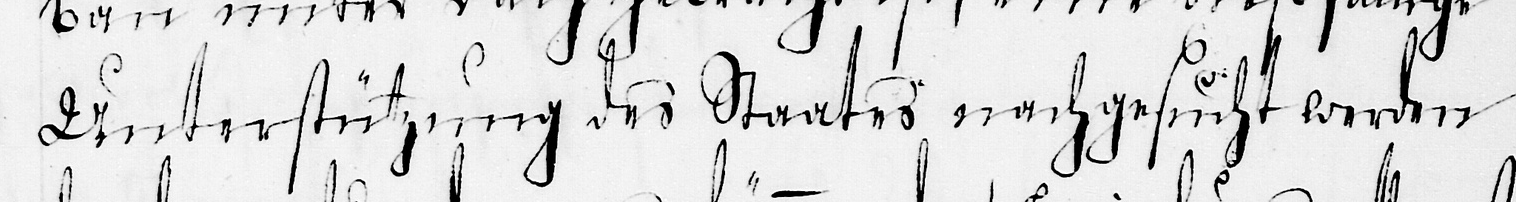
Unterstützung des Staates nachgesucht werden
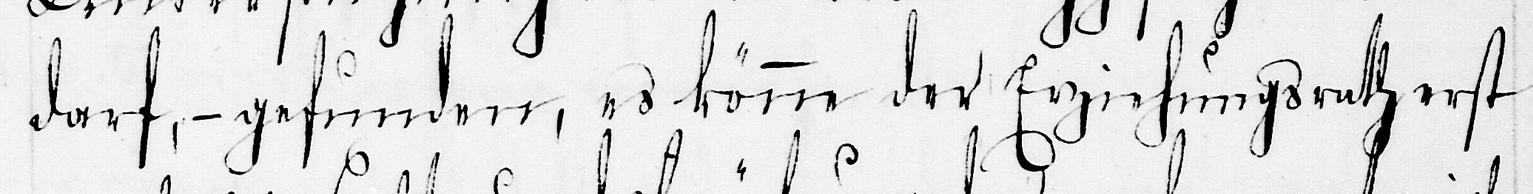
darf, – gefunden, es könne der Erziehungsrath erst
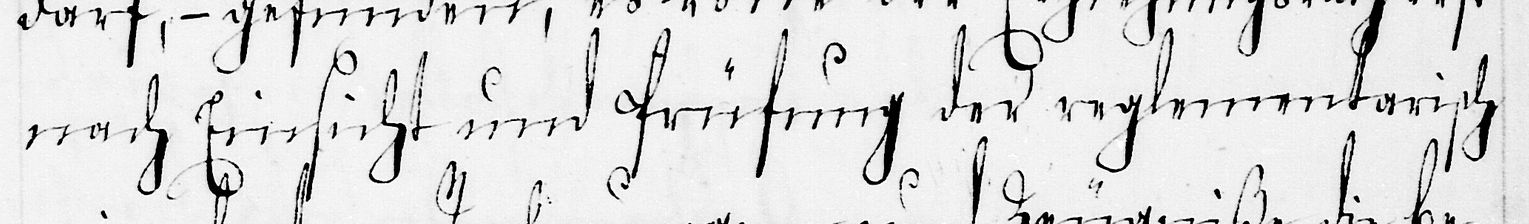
nach Einsicht und Prüfung der reglementarisch
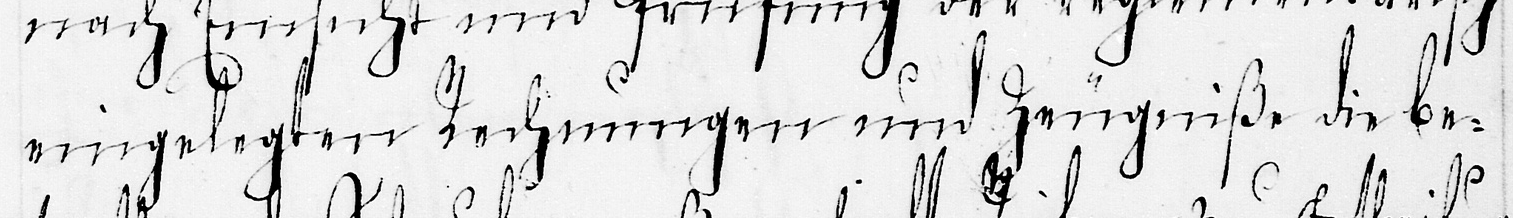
eingelegten Rechnungen und Zeugniße die be¬
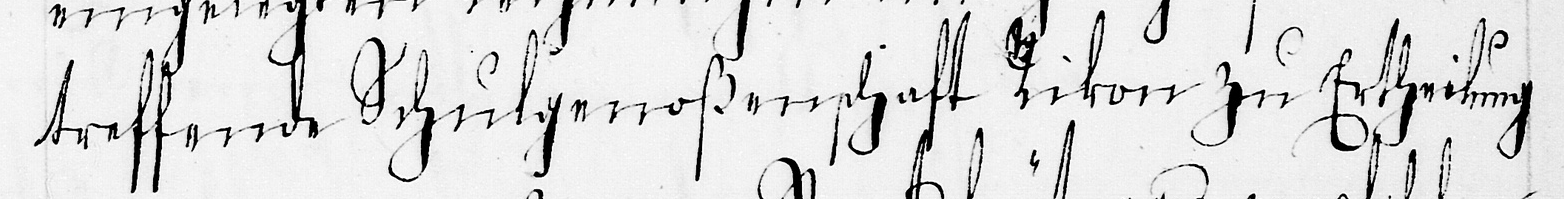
treffende Schulgenoßenschaft Rikon zu Ertheilung
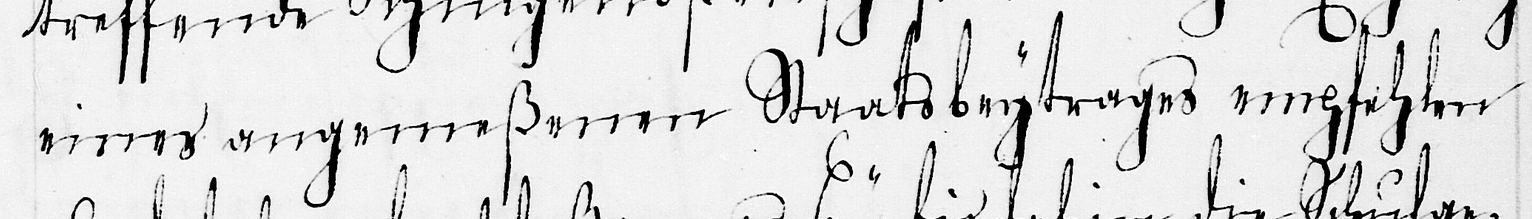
eines angemeßenen Staatsbeytrages empfehlen
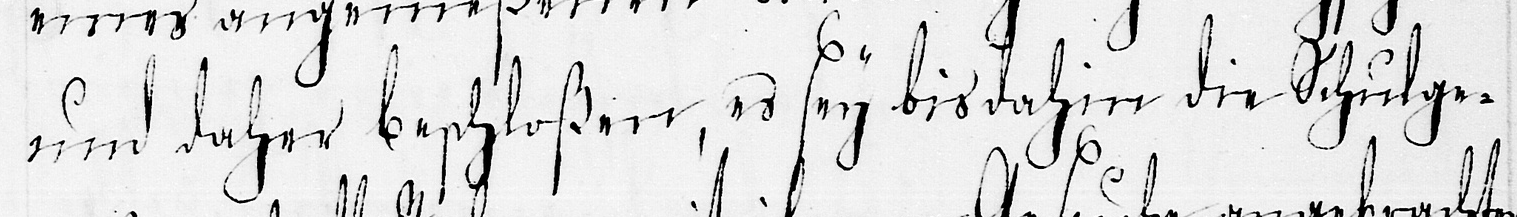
und daher beschloßen, es sey bis dahin die Schulge¬
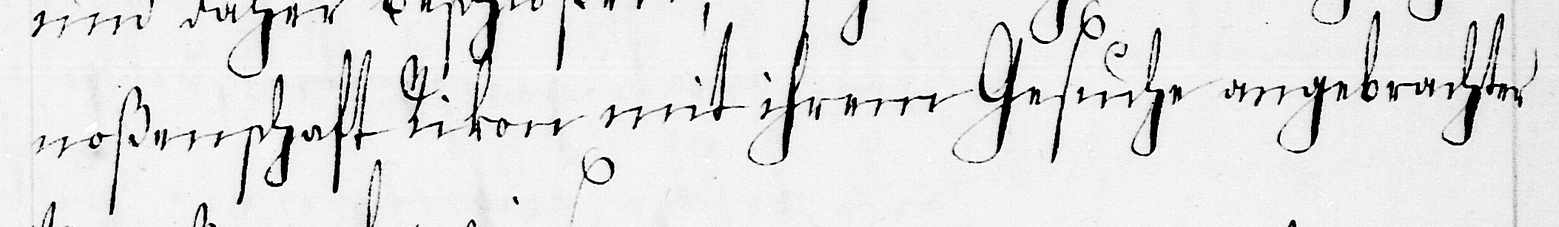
noßenschaft Rikon mit ihrem Gesuche angebrachter
